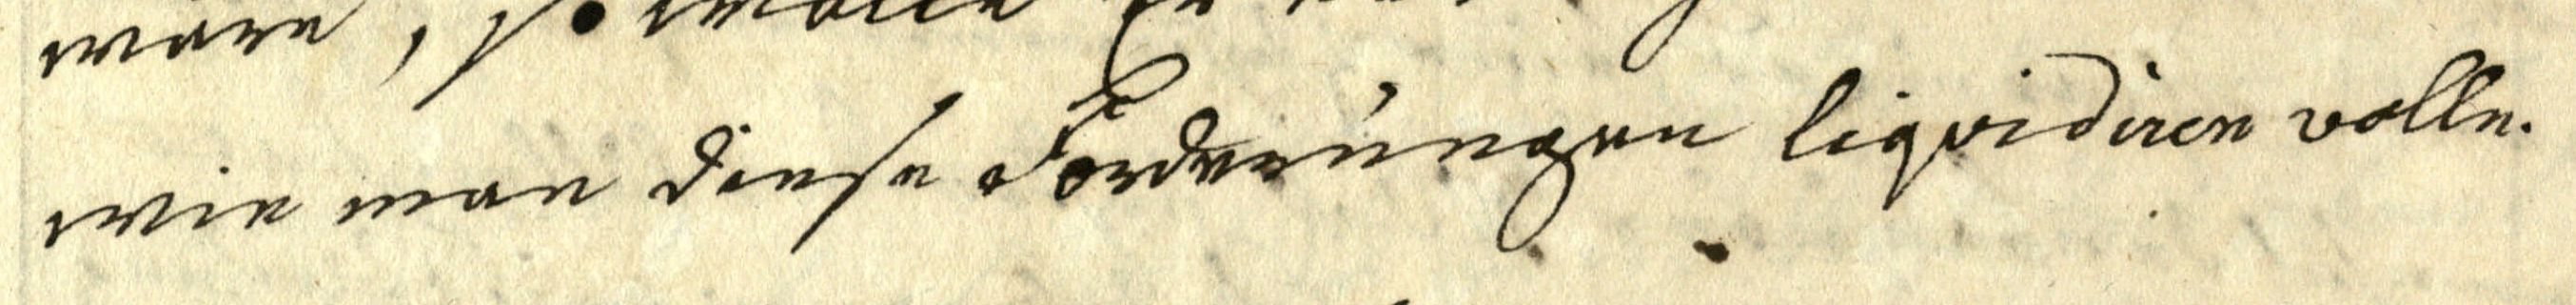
wie man diese Forderungen liquidiren wolle.
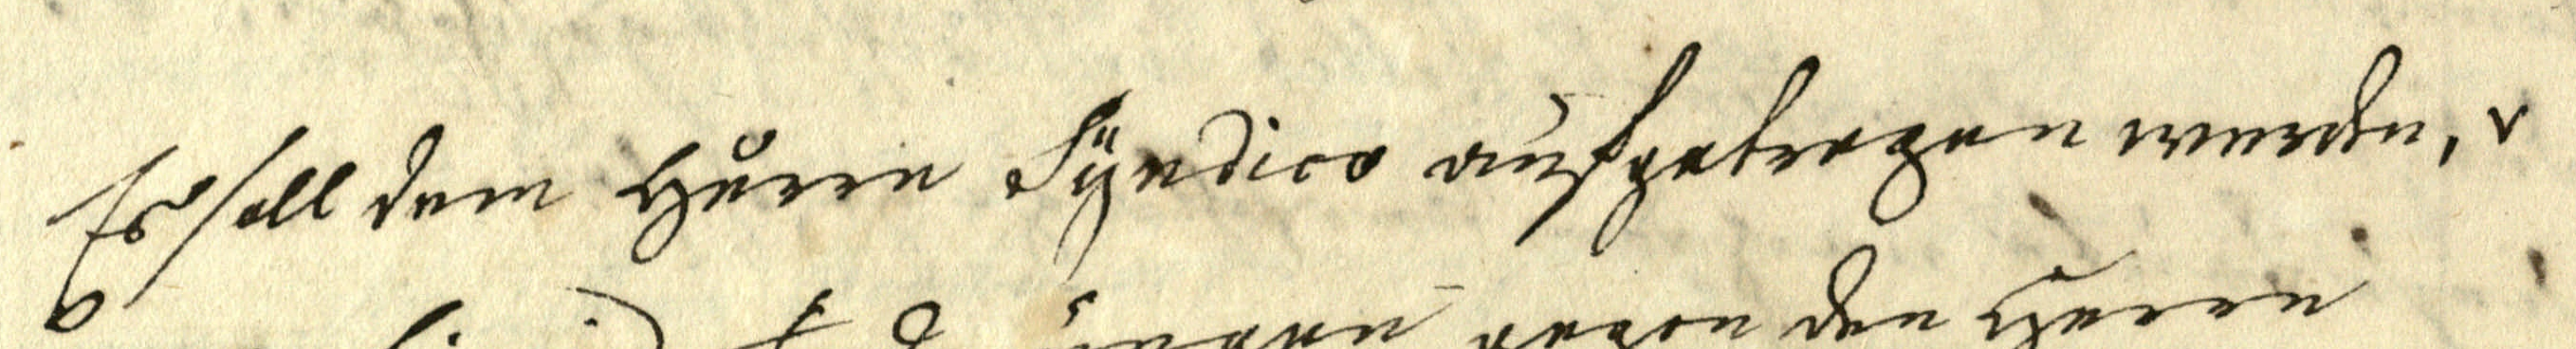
Es soll dem Herrn Sÿndico aufgetragen werden,
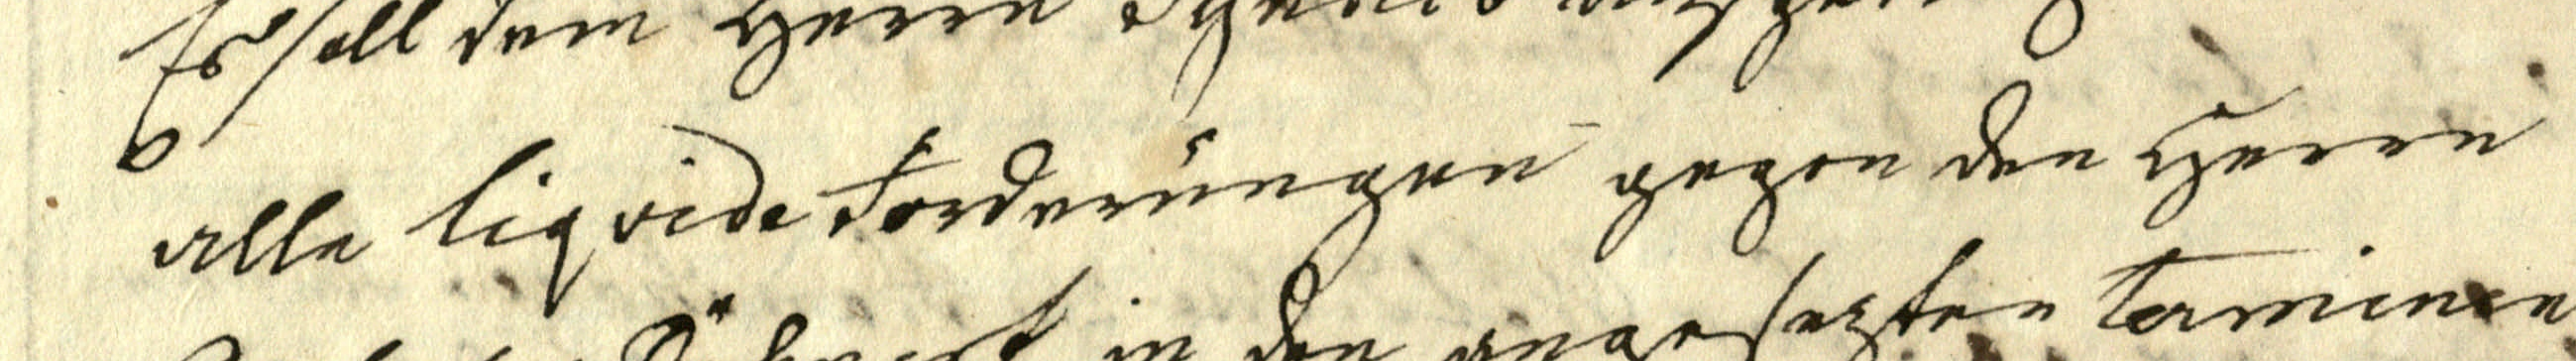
alle liquide Forderungen gegen den Herrn
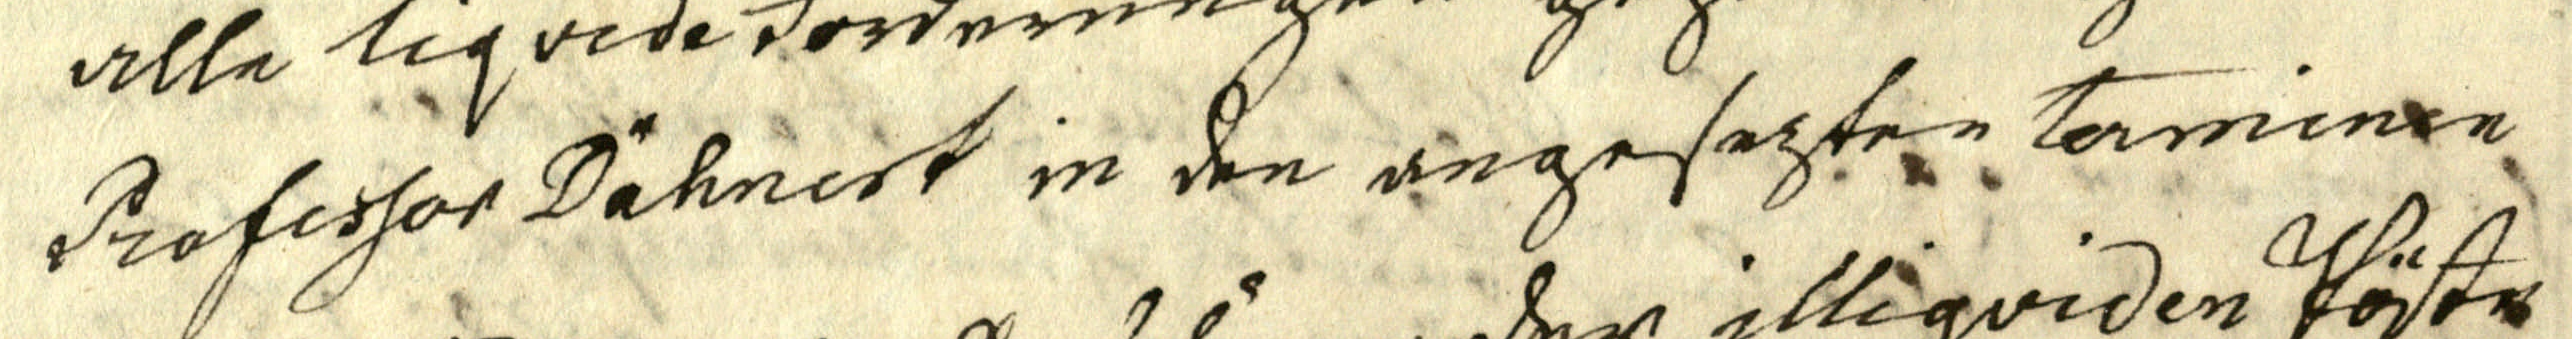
Professor Dähnert in den angesezten Terminen
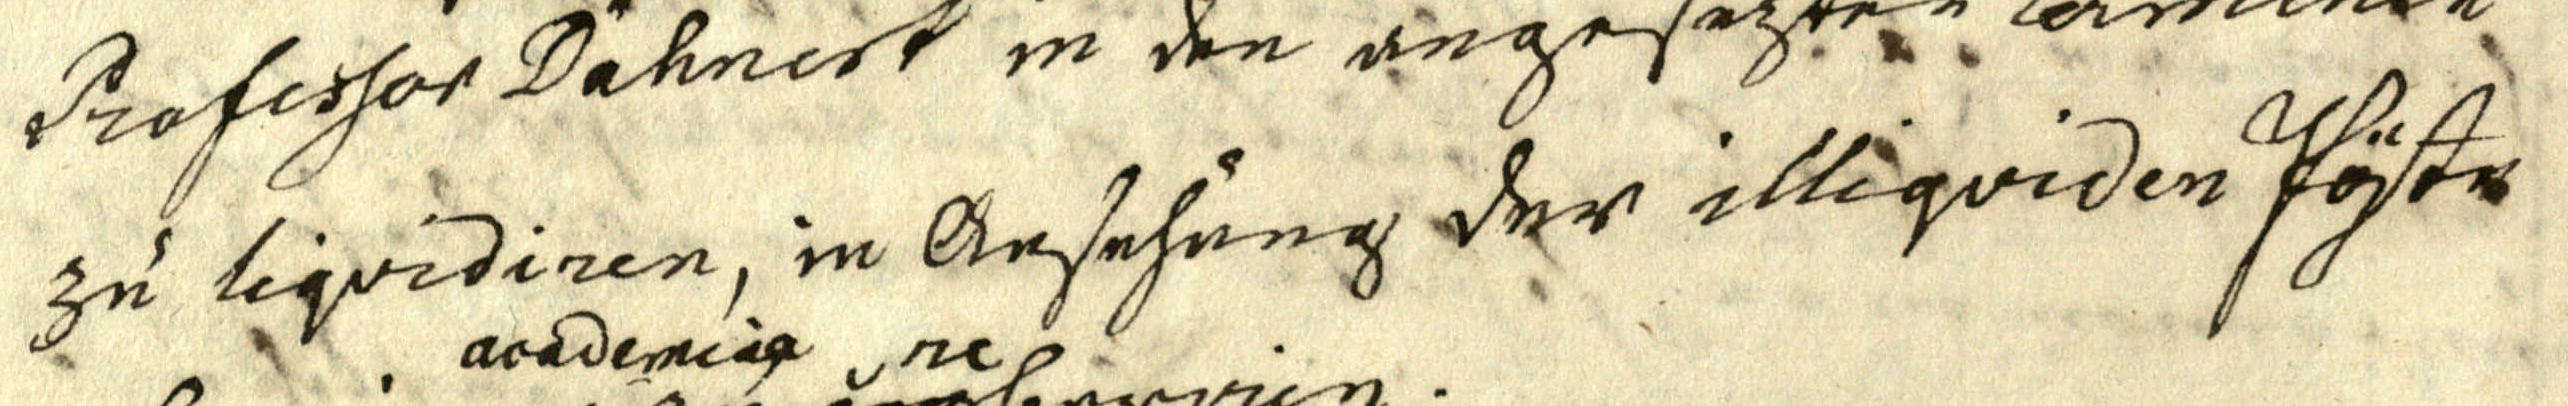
zu liquidiren, in Ansehung der illiquiden Pöste
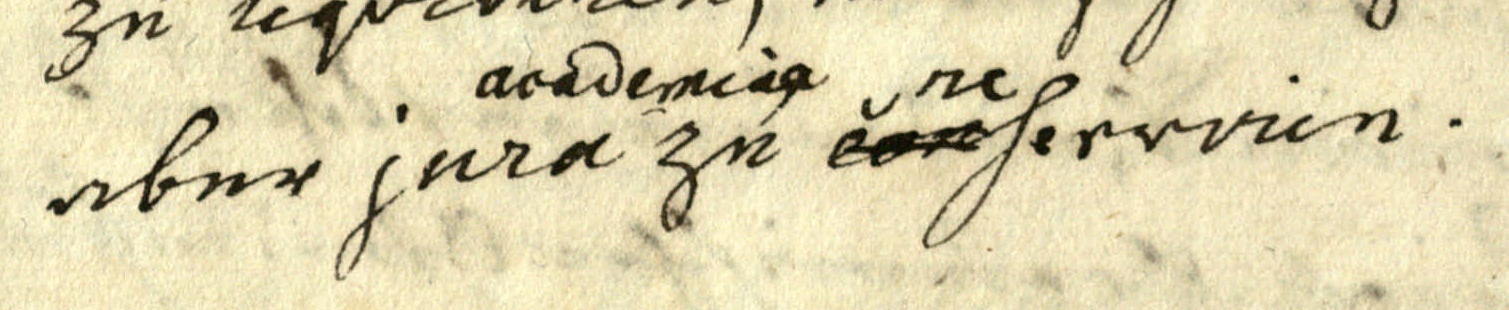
aber jura academica zu reserviren.
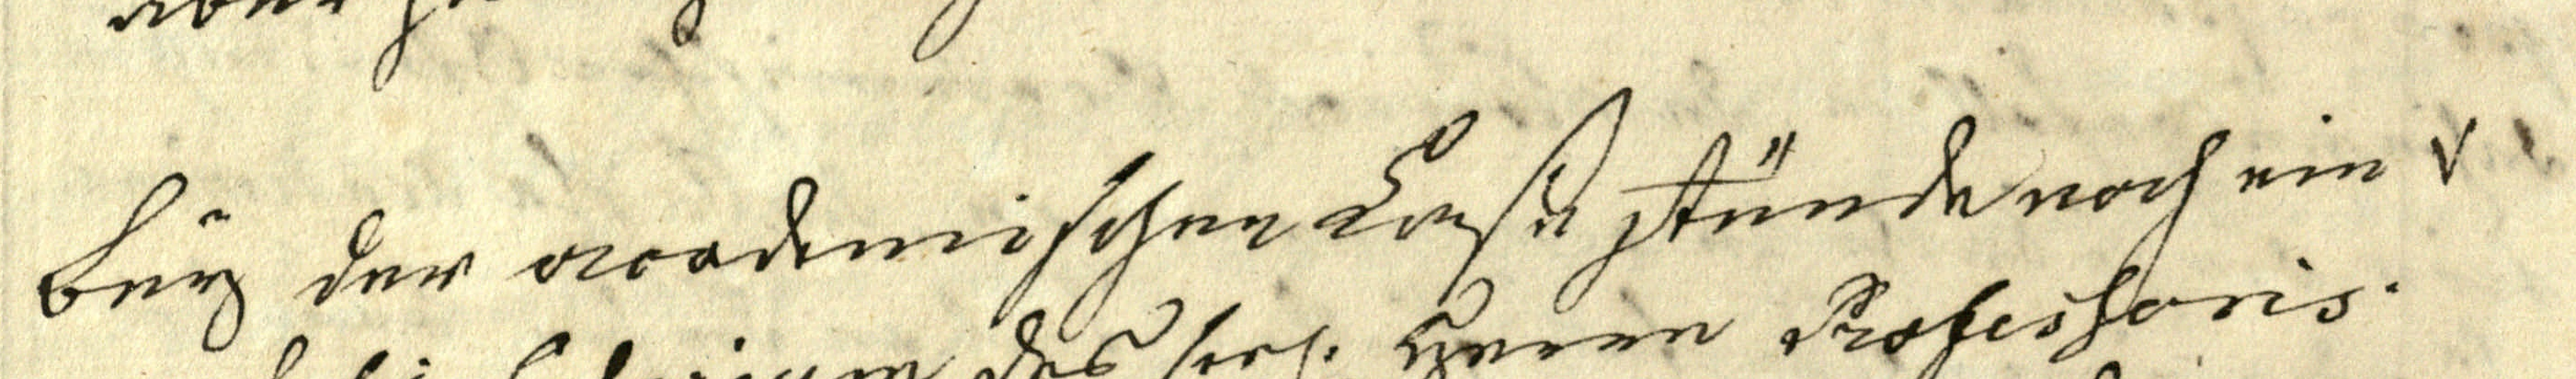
Beÿ der academischen Caße stünde noch ein
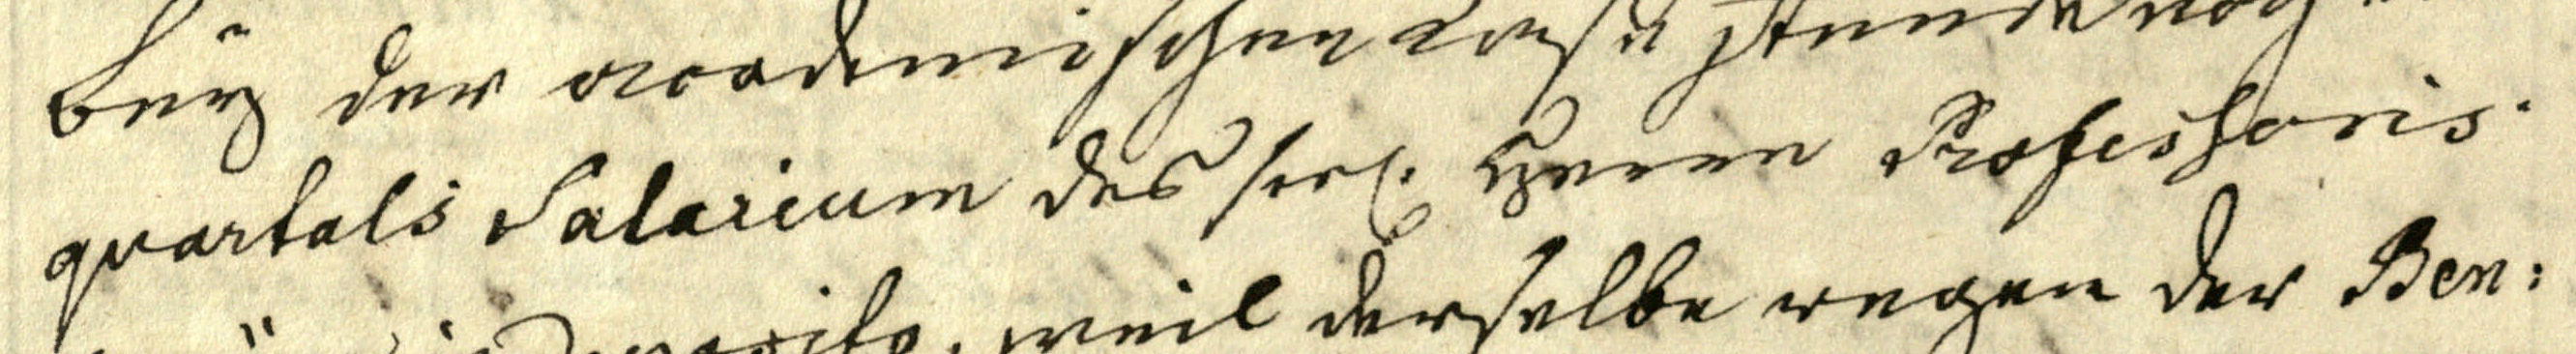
quartals Salarium des seel. Herrn Professoris
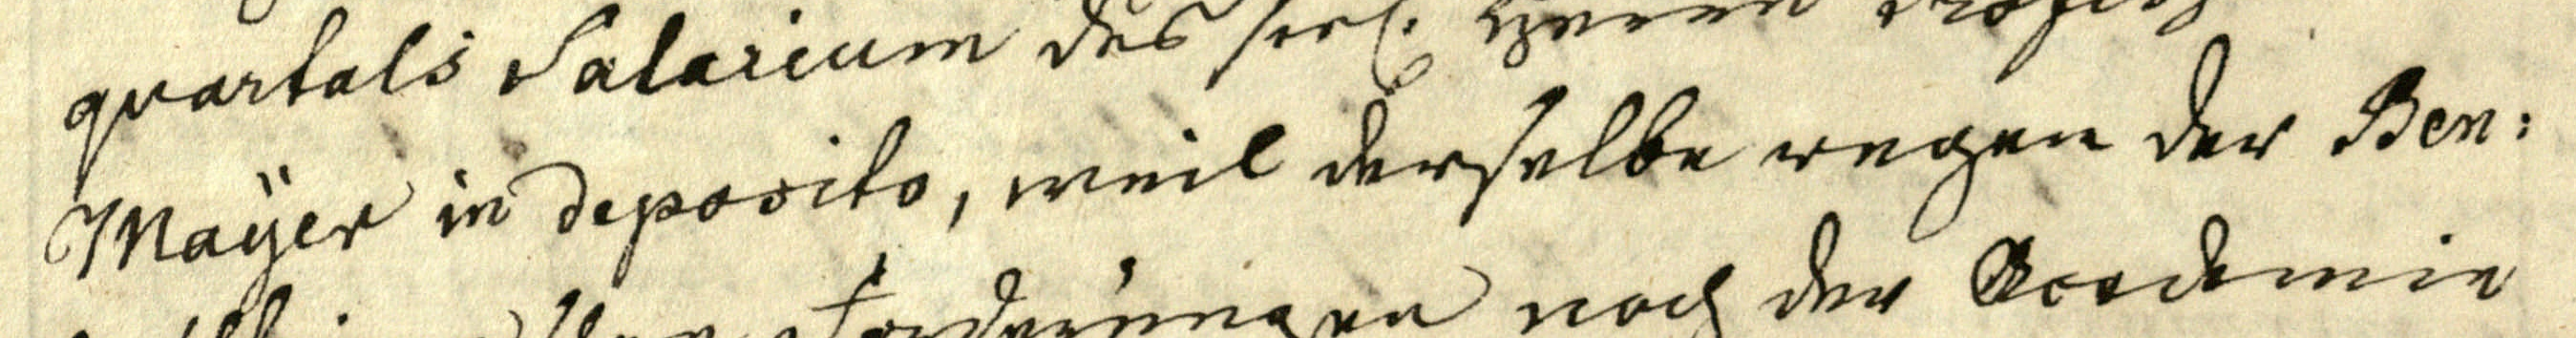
Maÿer in deposito, weil derselbe wegen der Ben¬
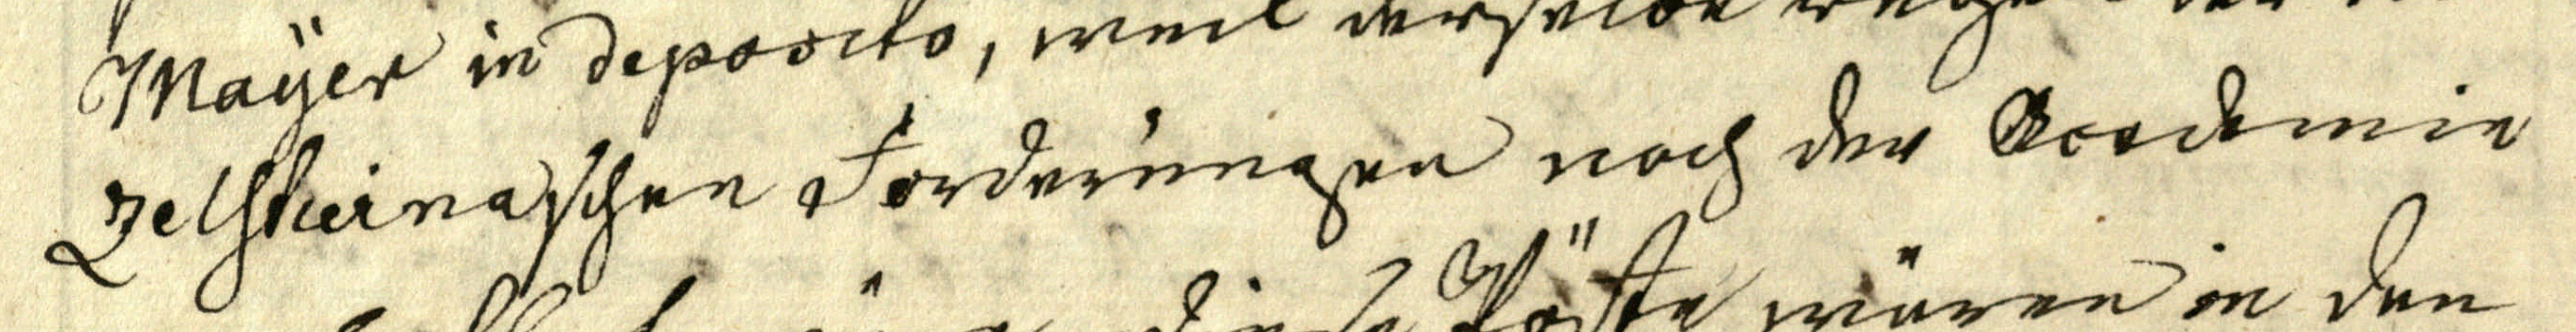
zelstiernaschen Forderungen noch der Academie
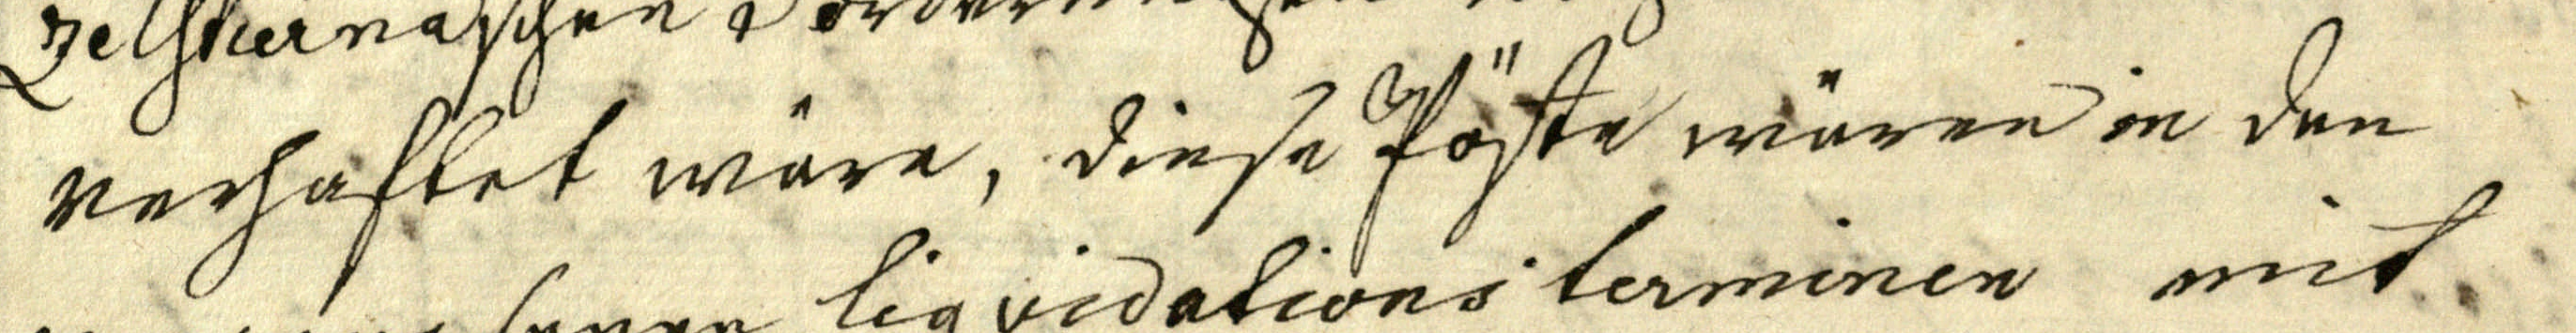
verhaftet wäre, diese Pöste wären in den
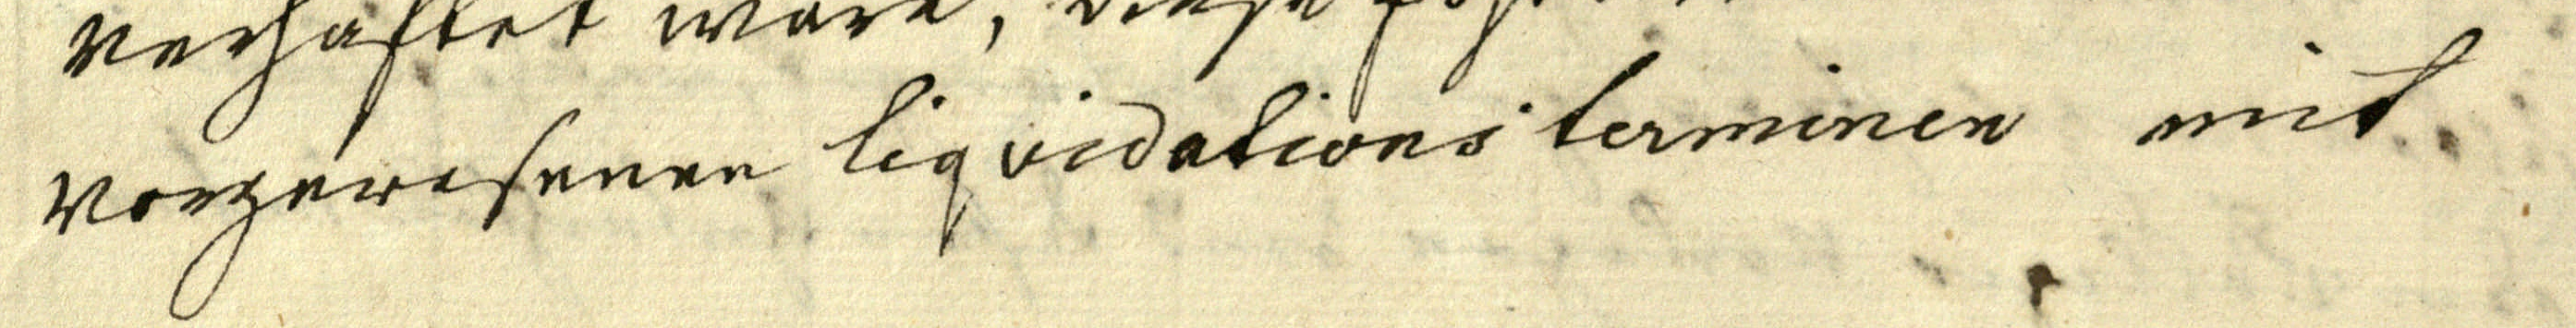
vorgewesenen liquidations terminen mit
